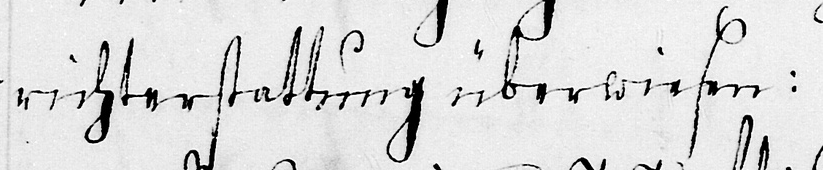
richterstattung überwiesen:
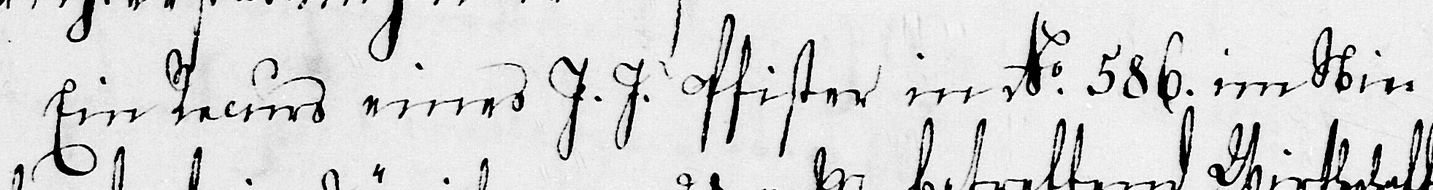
Ein Recurs eines J. J. Pfister in No. 586. im Nie¬
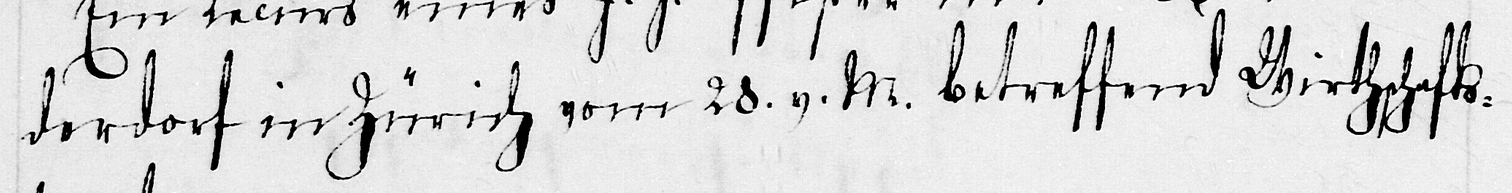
derdorf in Zürich vom 28. v. M. betreffend Wirthschafts¬
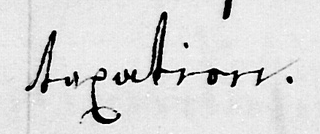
taxation.
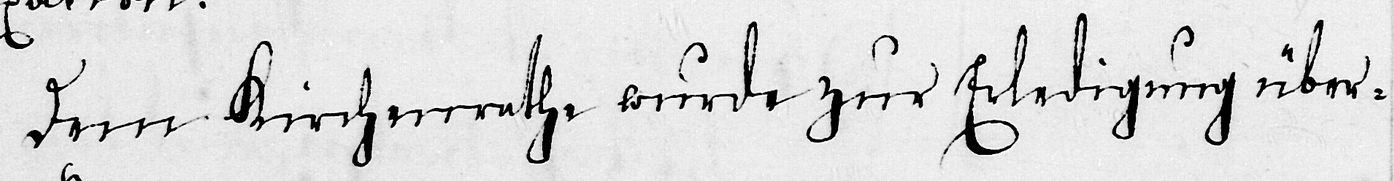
Dem Kirchenrathe wurde zur Erledigung über¬
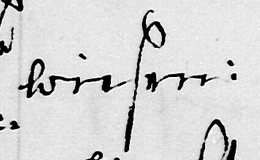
wiesen:
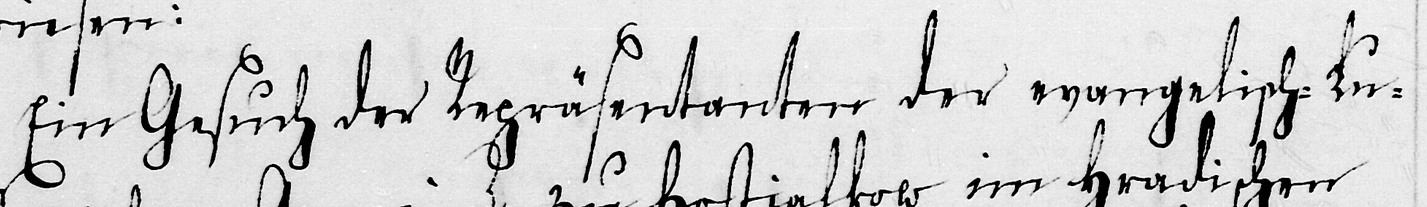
Ein Gesuch der Repräsentanten der evangelisch-lu¬
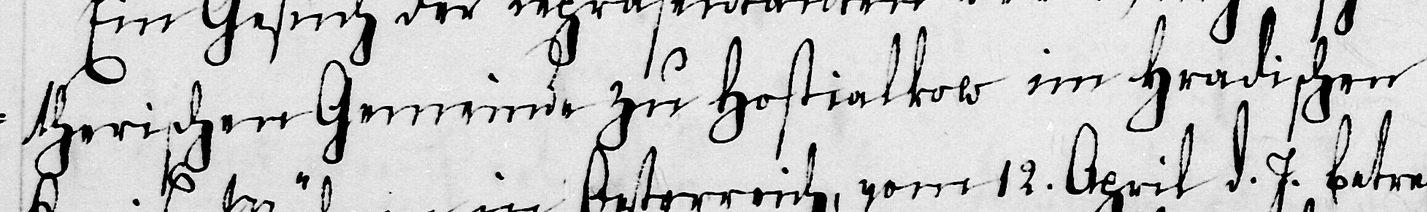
therischen Gemeinde zu Hostialkow im Hradischen
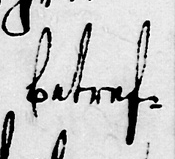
betre¬
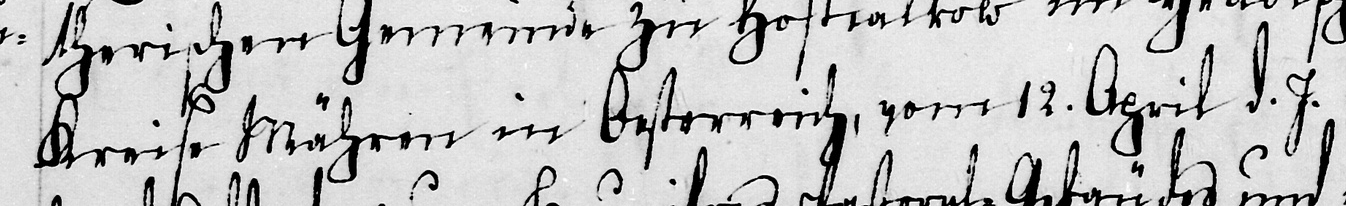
Kreise Mähren in Oesterreich, vom 12. April d. J.
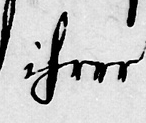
ihrer
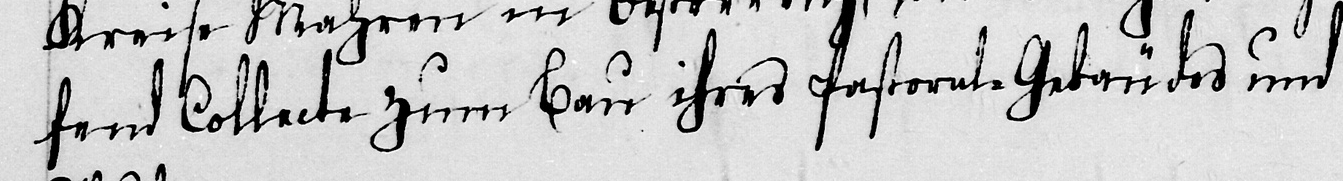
ffend Collecte zum Bau ihres Pastoral-Gebäudes und
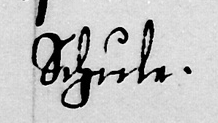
Schule.
